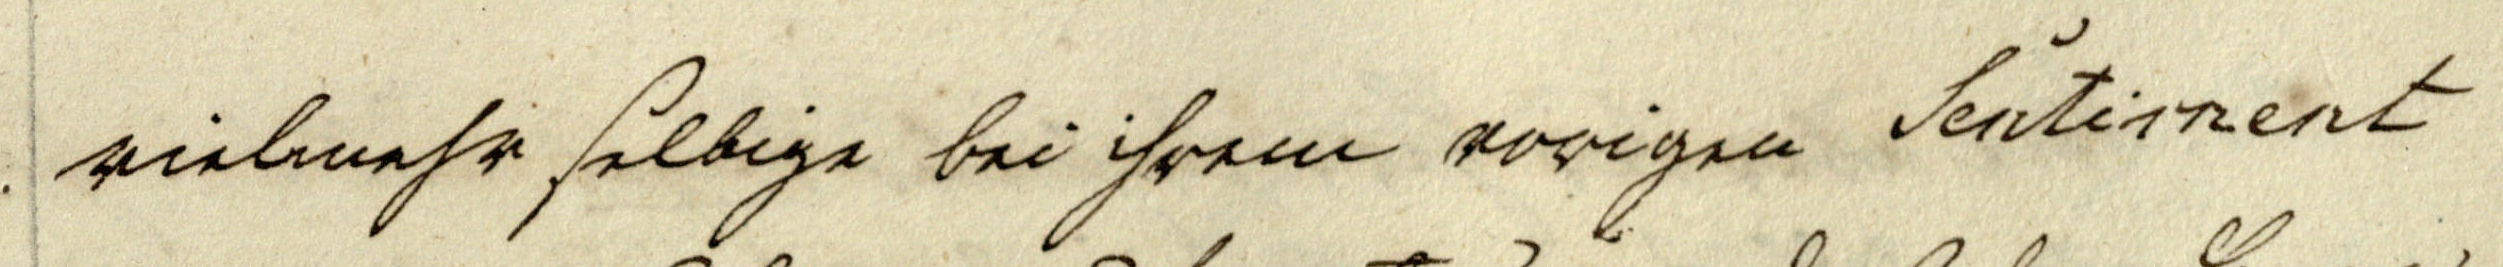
vielmehr selbige bei ihrem vorigen Sentiment
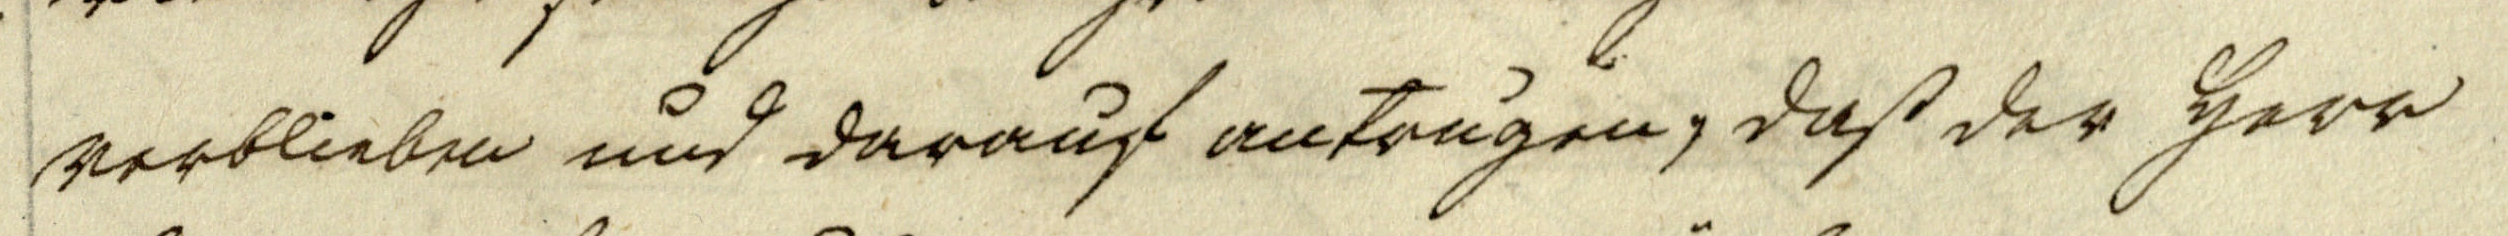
verblieben und darauf antragen, daß der Herr
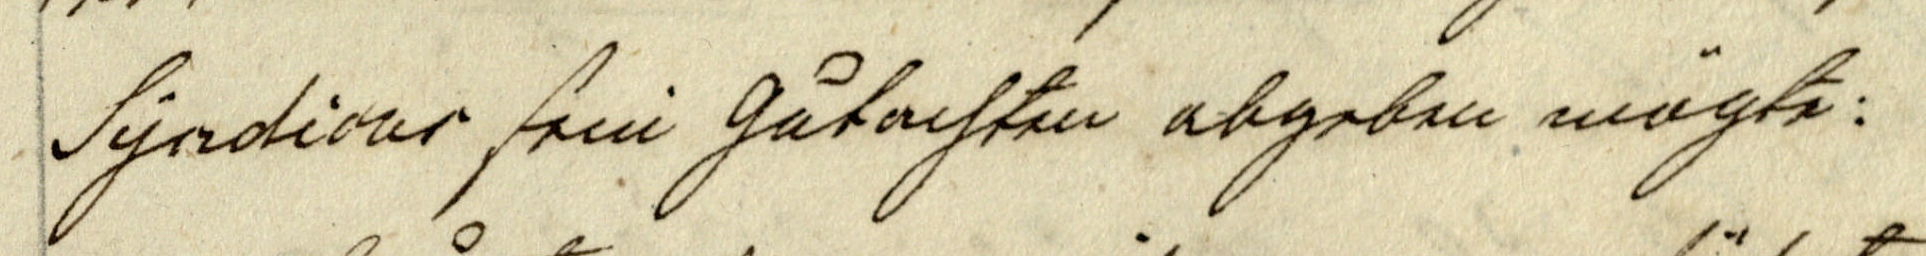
Sÿndicus sein Gutachten abgeben mögte:
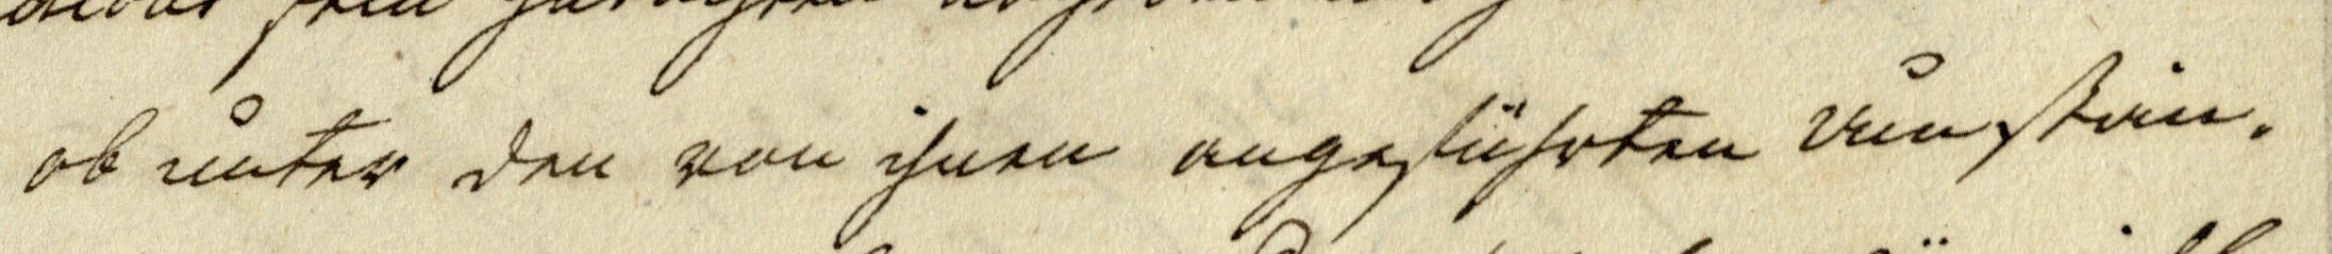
ob unter den von ihnen angeführten Umstän¬
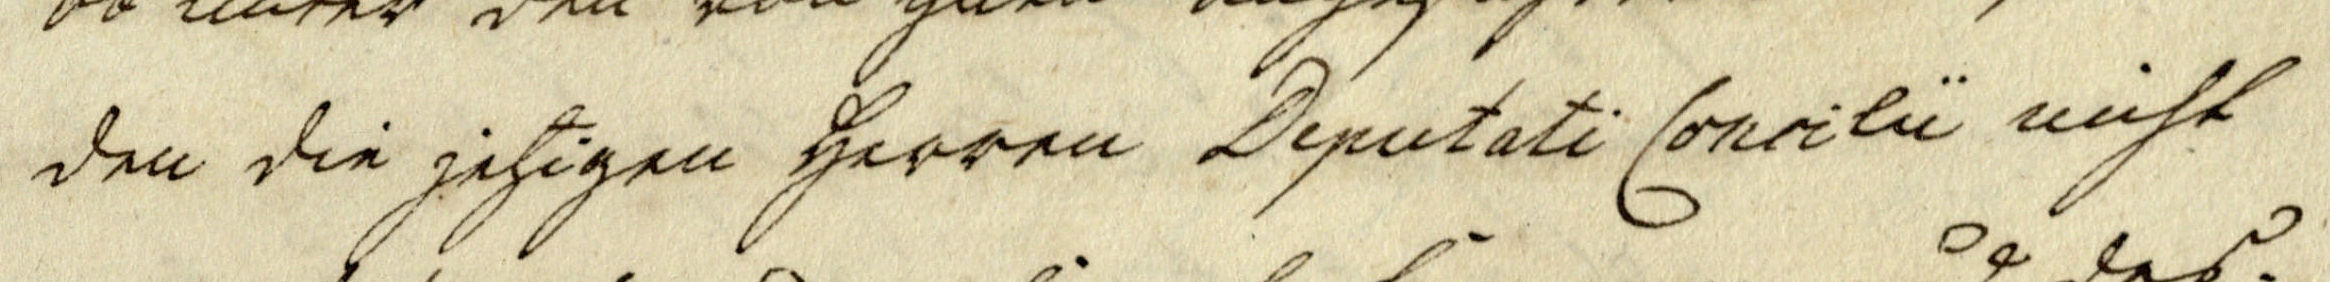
den die jetzigen Herren Deputati Concilii nicht
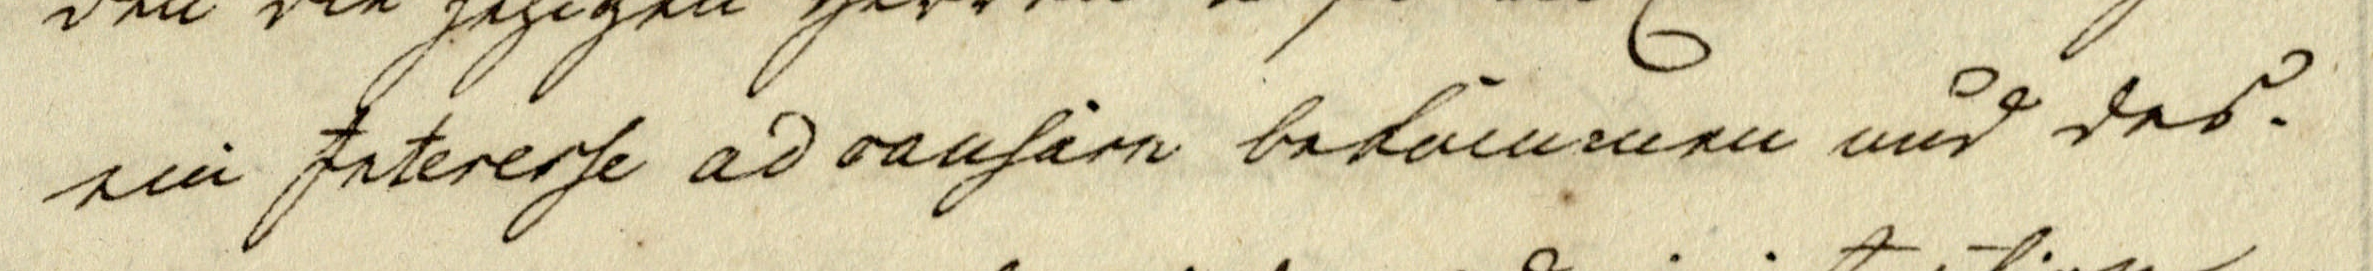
ein Interesse ad causam bekommen und des¬
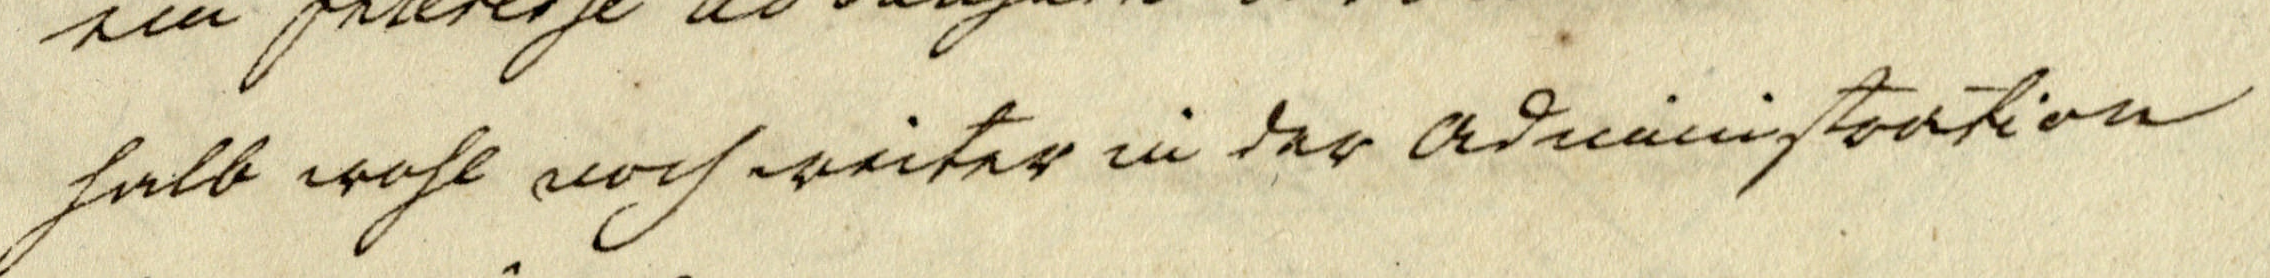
halb wohl noch weiter in der Administration
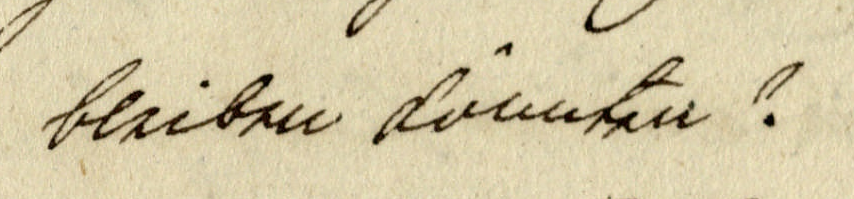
bleiben könnten?
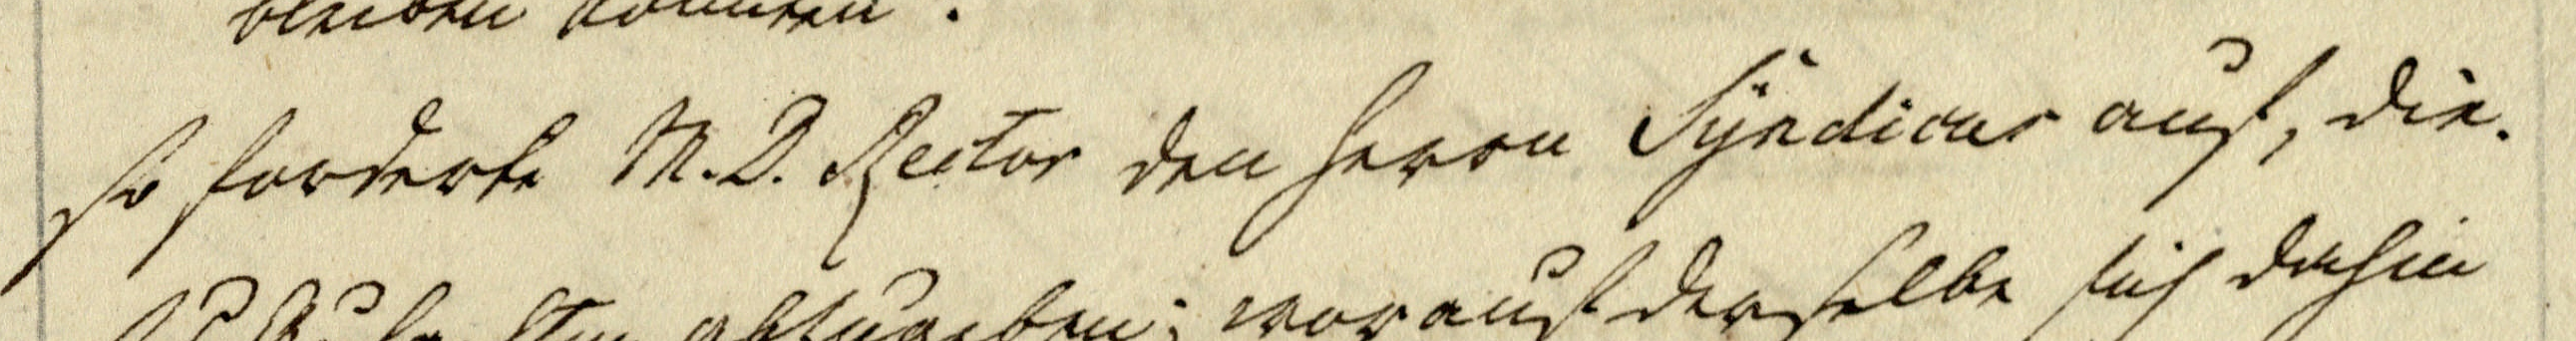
so forderte M. D. Rector den Herrn Sÿndicus auf, die¬
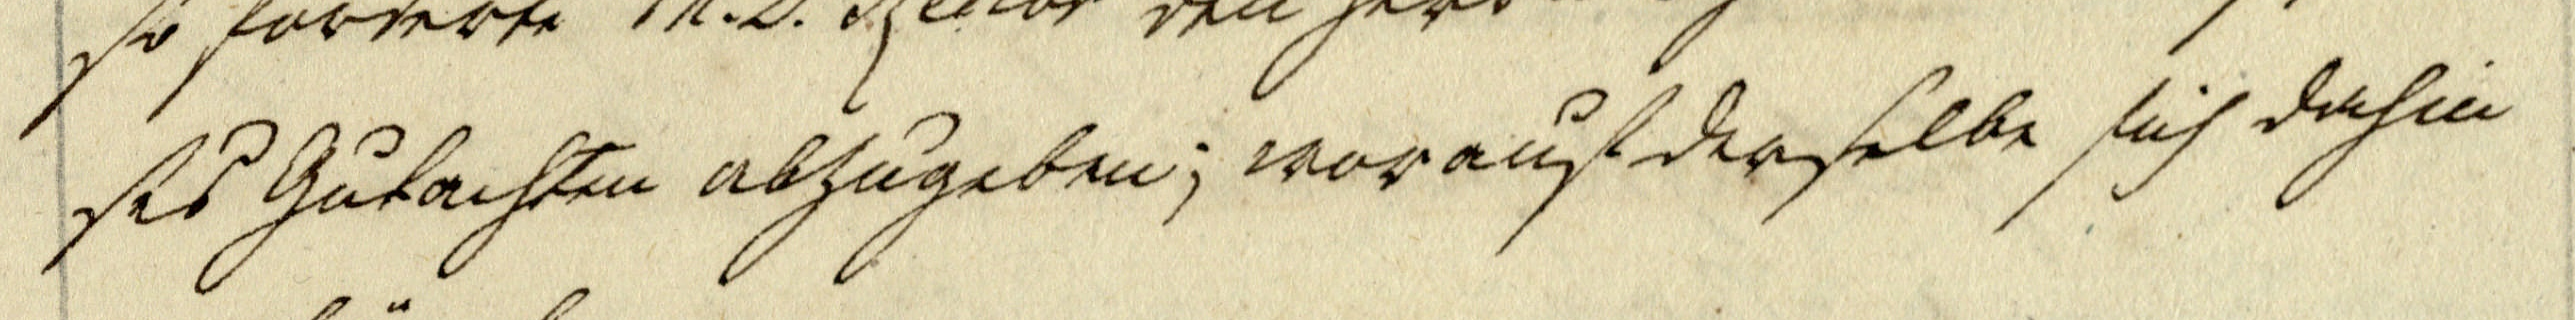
ses Gutachten abzugeben; worauf derselbe sich dahin
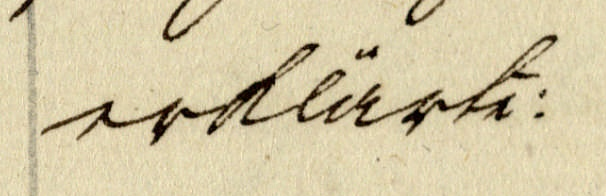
erklärte:
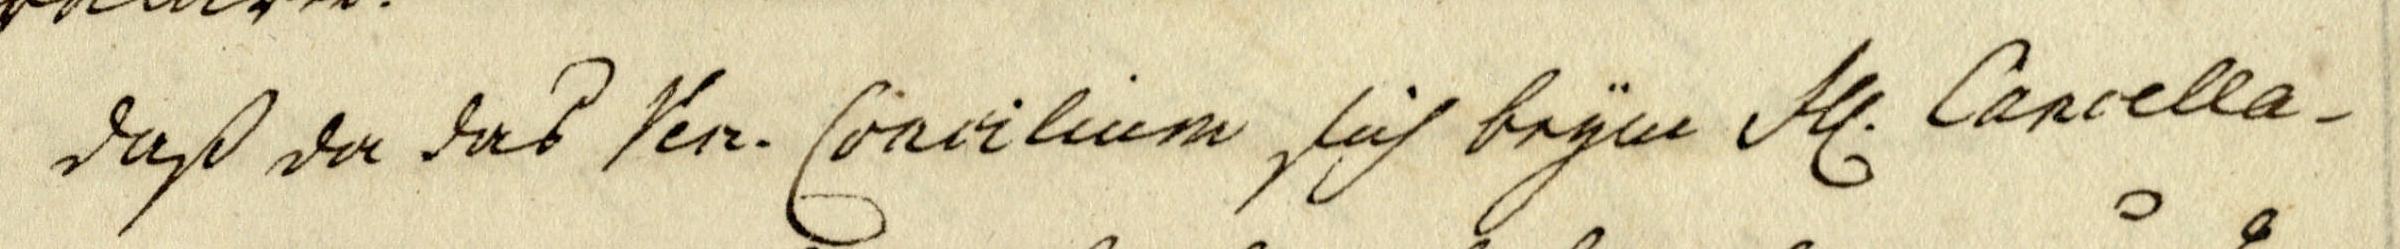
daß da das Ven. Concilium sich beÿm Ill. Cancella¬
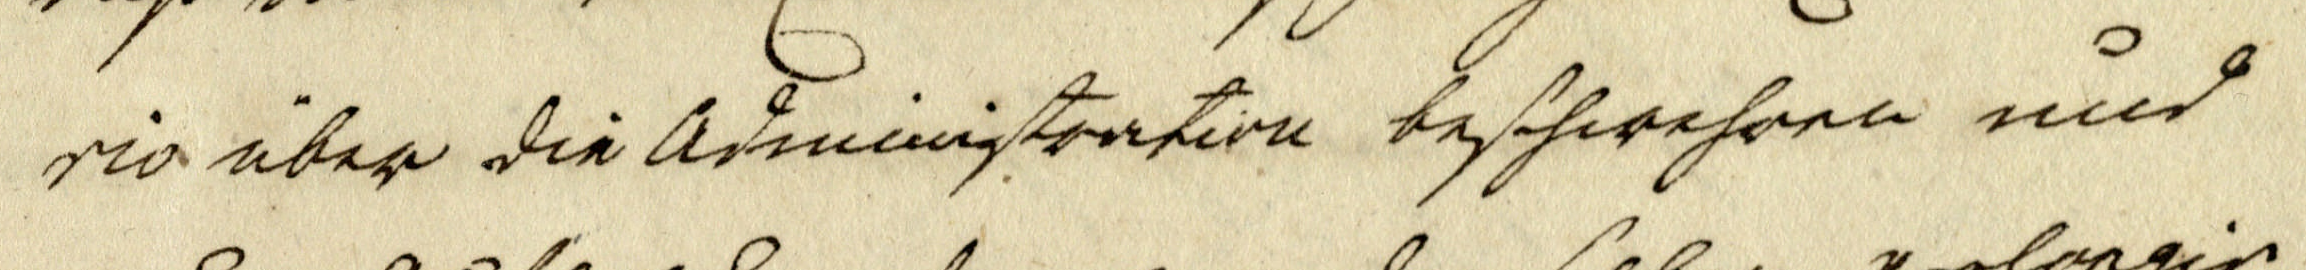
rio über die Administration beschwehren und
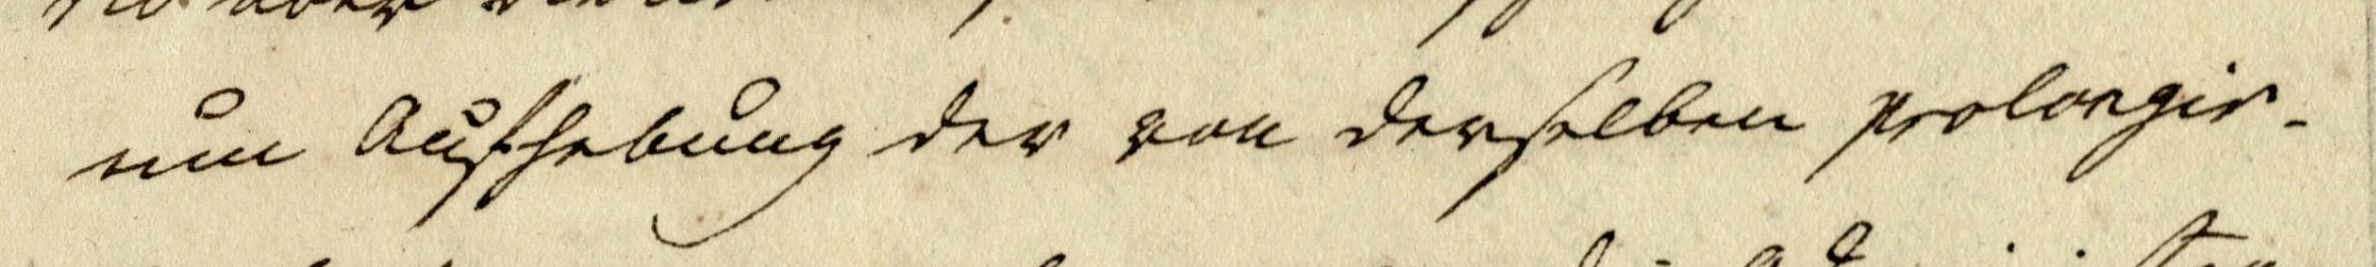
um Aufhebung der von derselben prolongir¬
